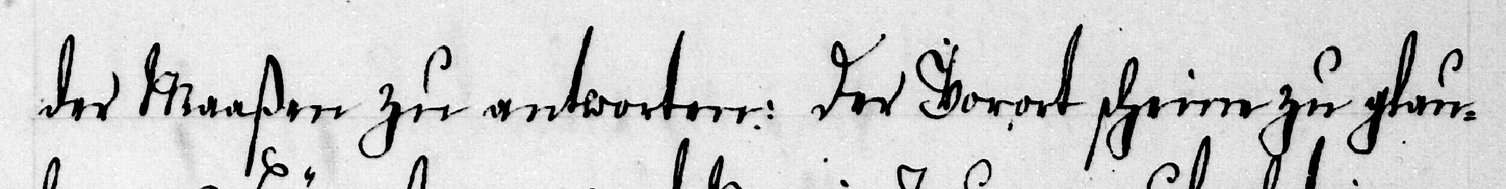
der Maaßen zu antworten: Der Vorort scheine zu glau¬
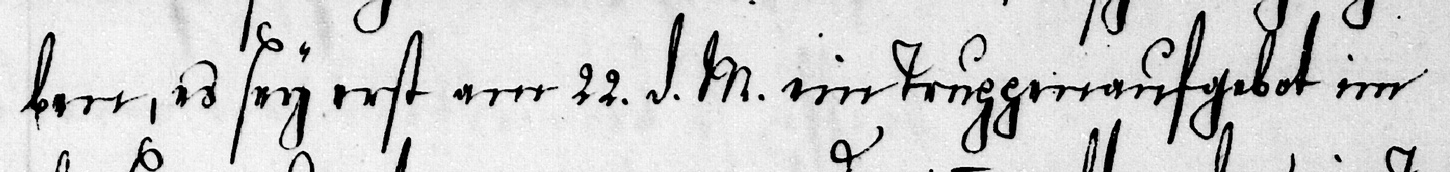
ben, es sey erst am 22. d. M. ein Truppenaufgebot im
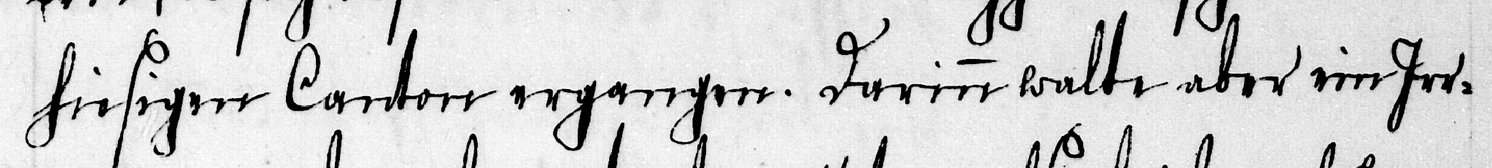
hiesigen Canton ergangen. Darin walte aber ein Irr¬
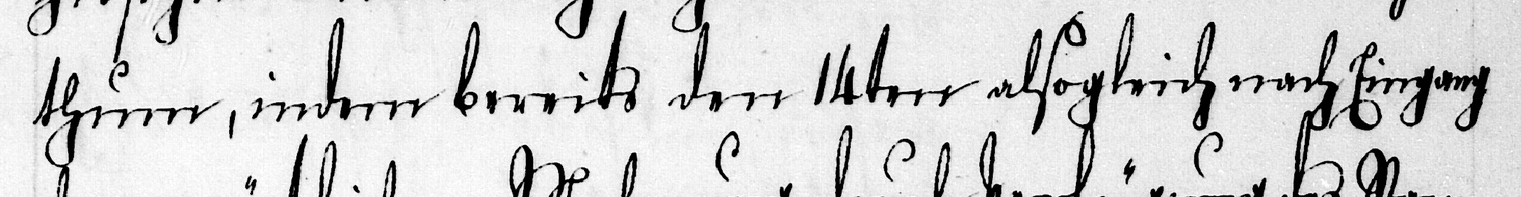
thum, indem bereits den 14ten alsogleich nach Eingang
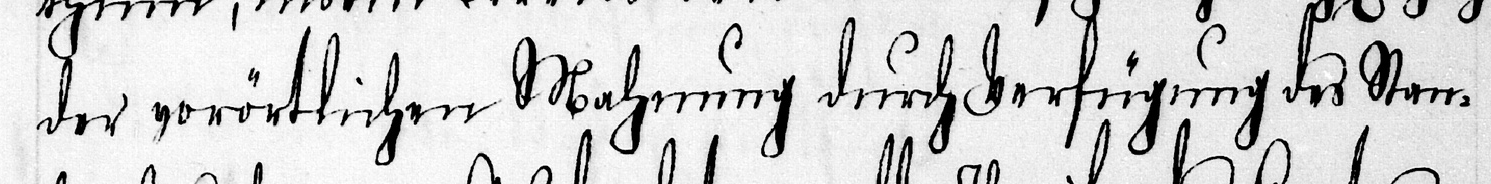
der vorörtlichen Mahnung durch Verfügung des Stan¬
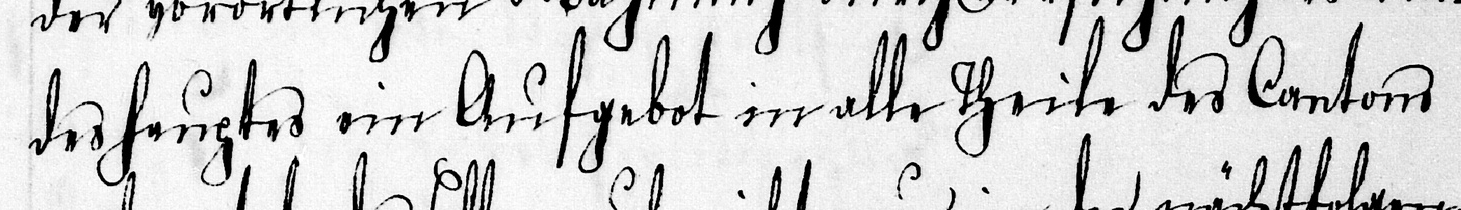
deshauptes ein Aufgebot in alle Theile des Cantons
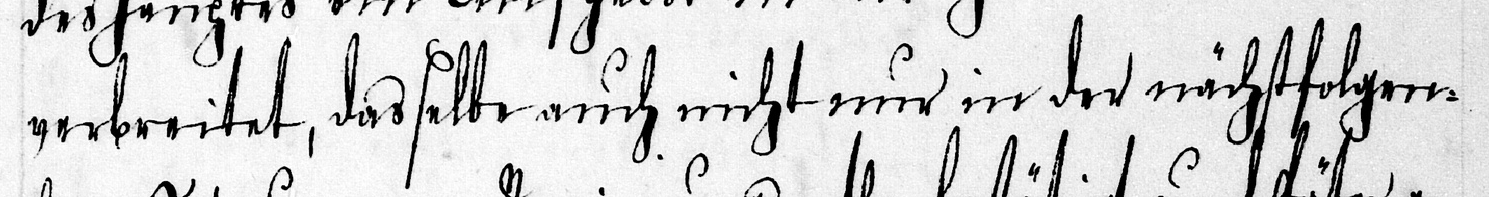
verbreitet, dasselbe auch nicht nur in der nächstfolgen¬
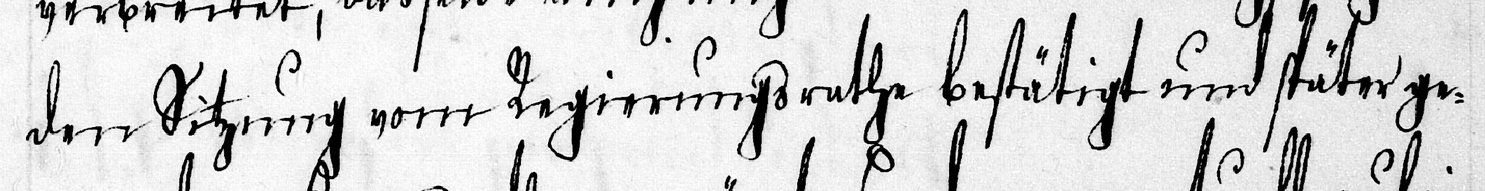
den Sitzung vom Regierungsrathe bestätigt und später ge¬
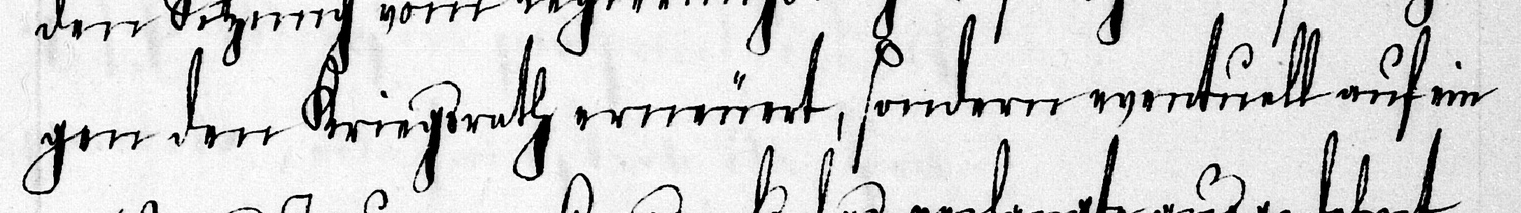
gen den Kriegsrath erneuert, sondern eventuell auf ein
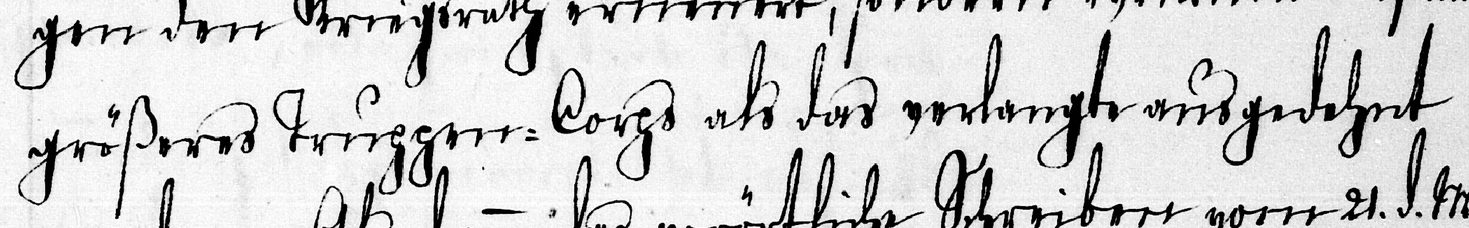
größeres Truppen-Corps als das verlangte ausgedehnt
